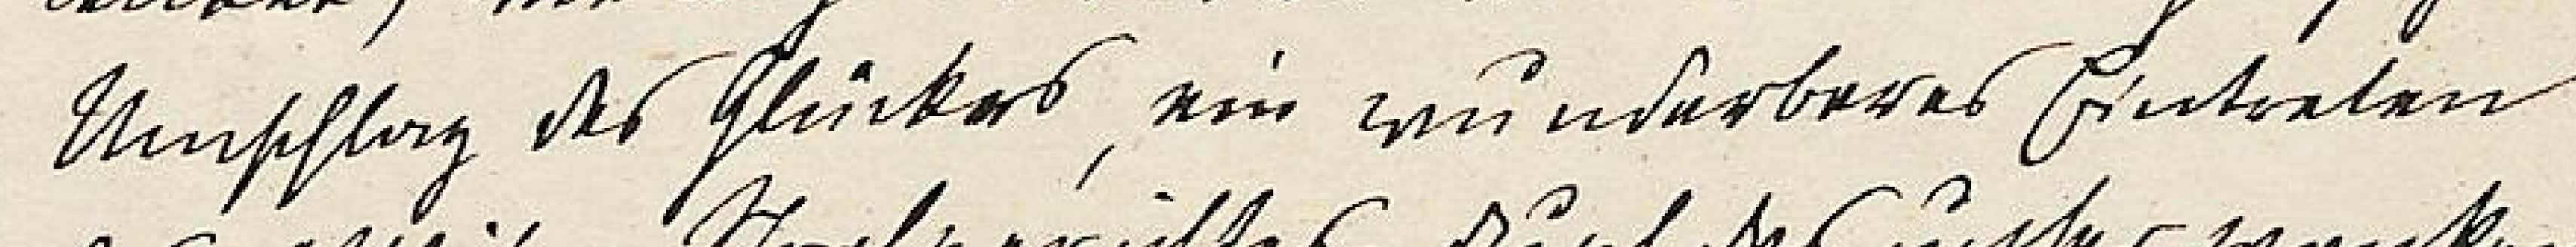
Umschlag des Glückes, ein wunderbares Eintreten
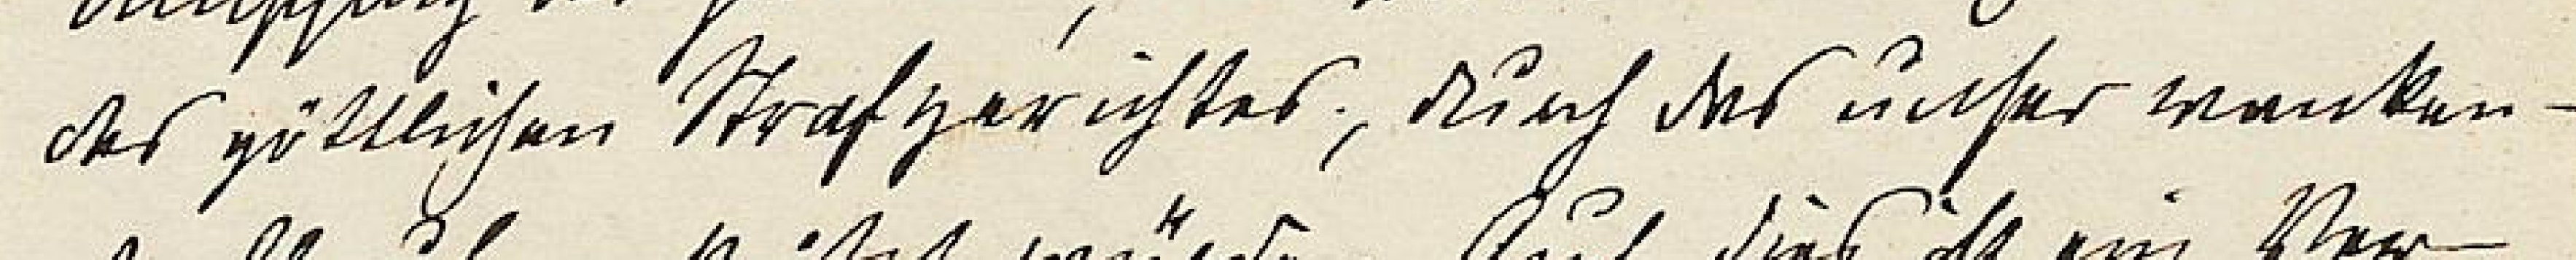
des götlichen Strafgerichtes, durch das unser wanken¬
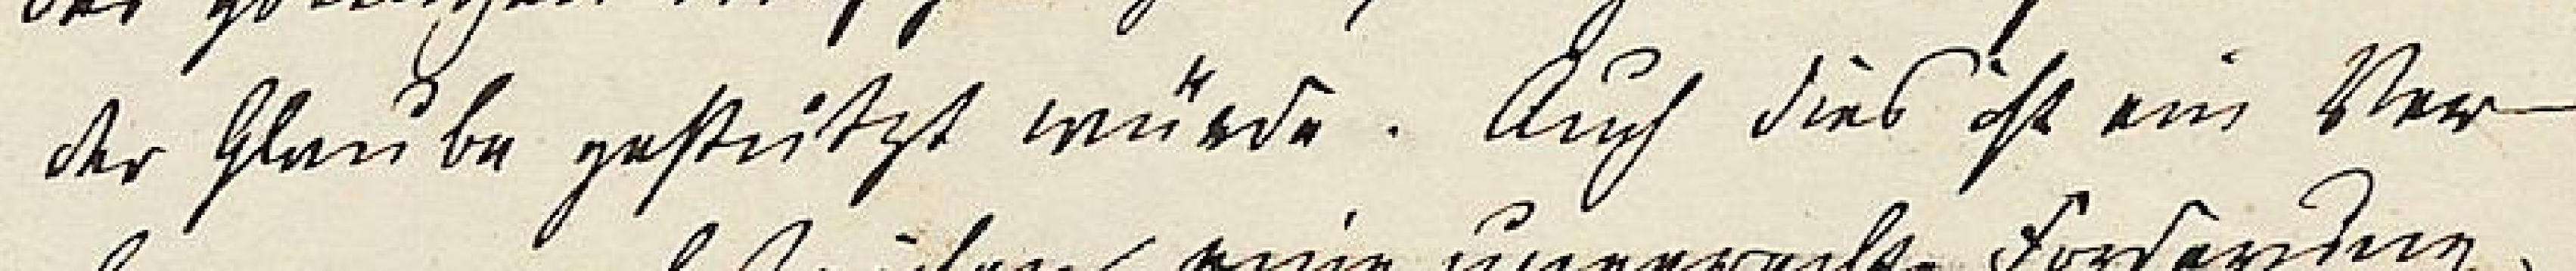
der Glaube gestützt würde. Auch dies ist ein Ver¬
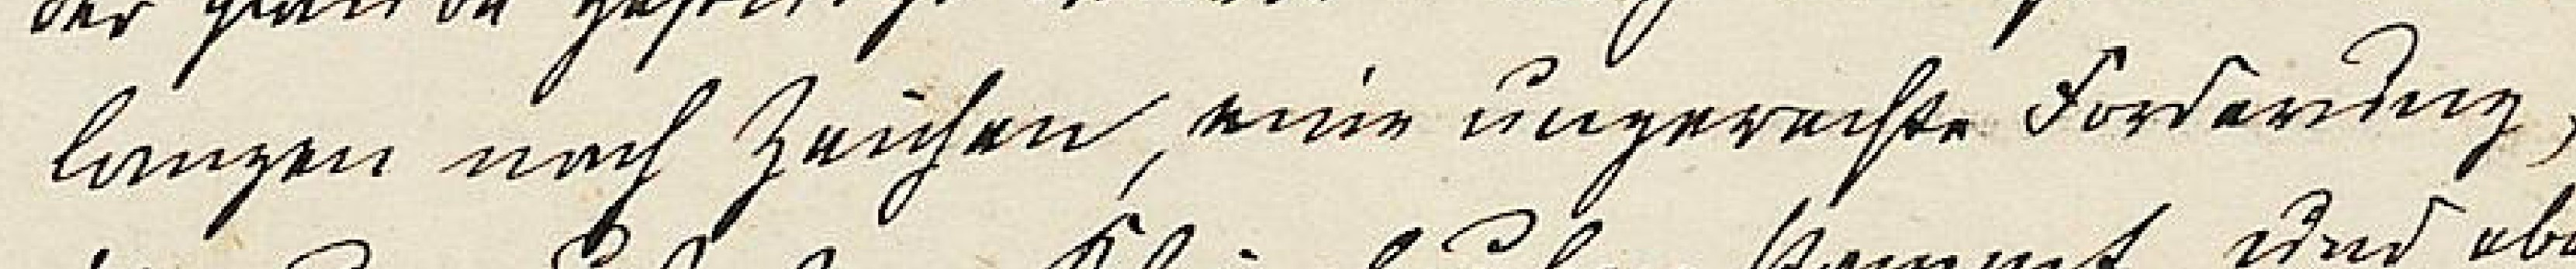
langen nach Zeichen, eine ungerechte Forderung,
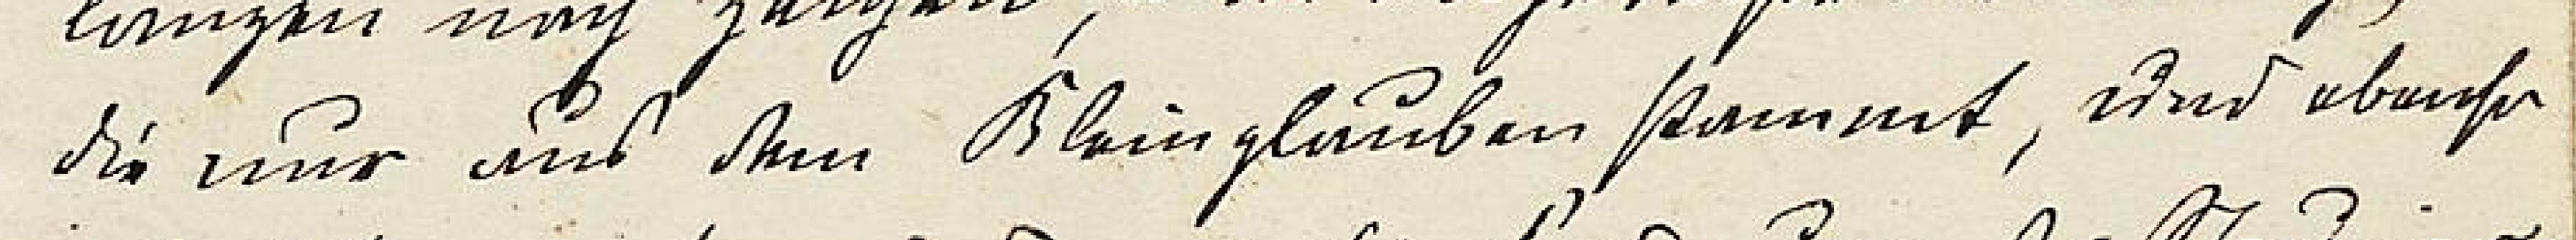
die nur aus dem Kleinglauben stammt, und ebenso
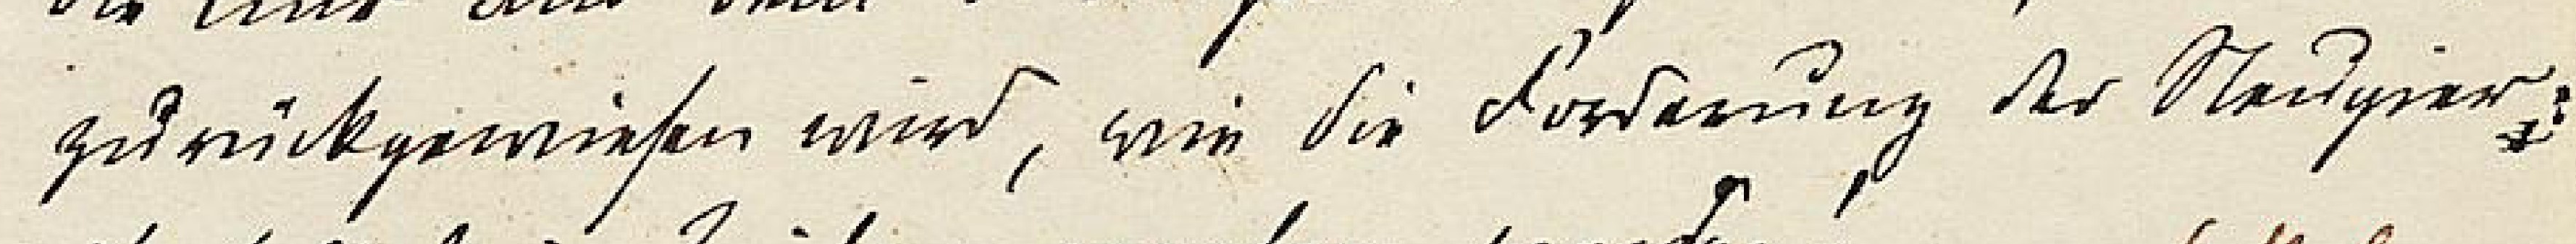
zurücktgewiesen wird, wie die Forderung der Neugier:
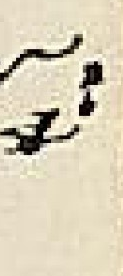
,
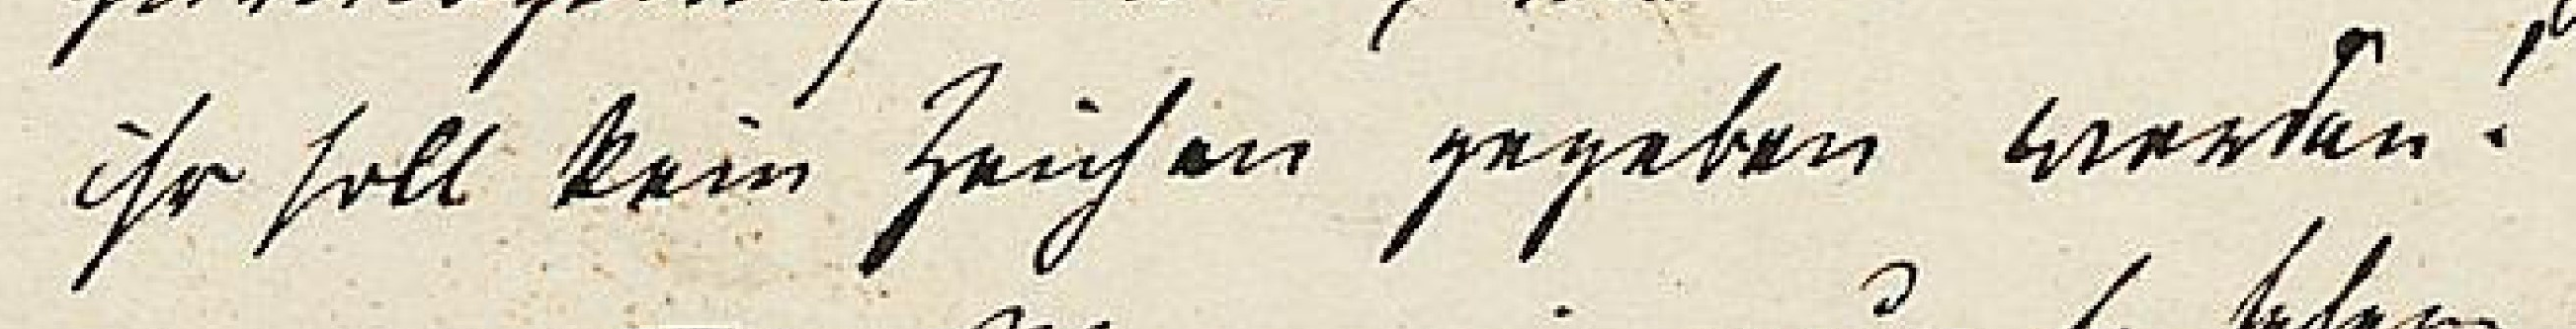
ihr soll kein Zeichen gegeben werden!
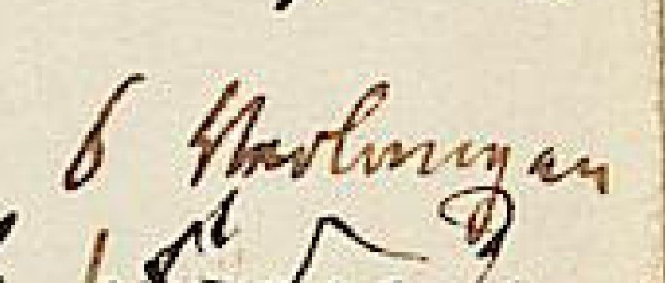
s Verlangen
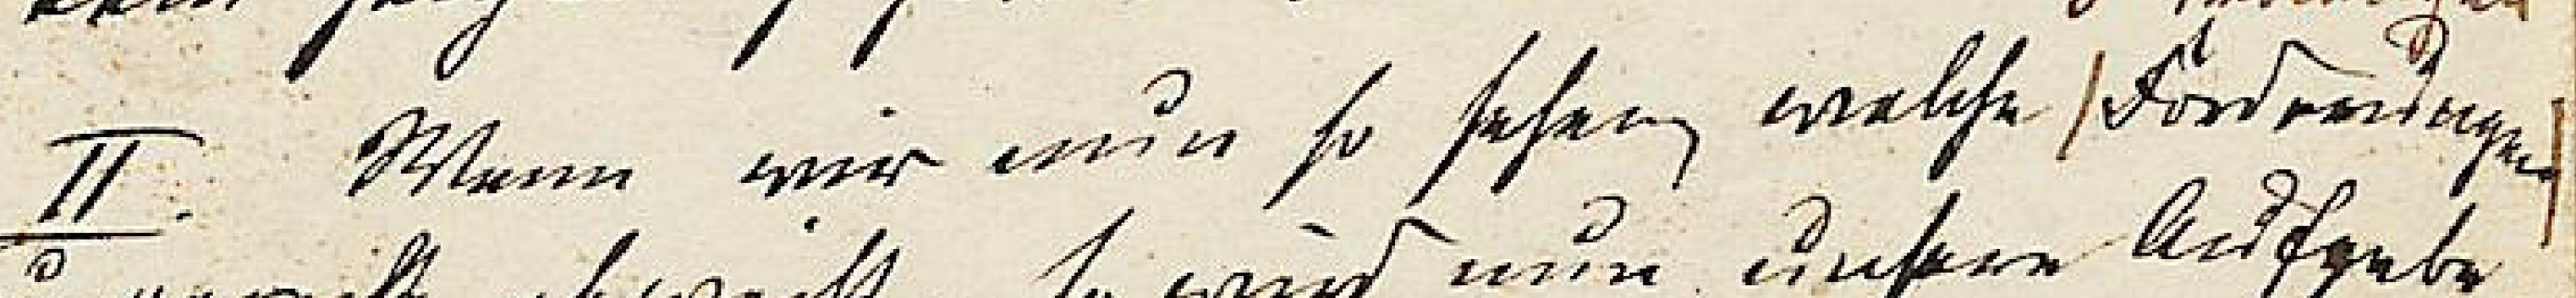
II. Wenn wir nun so sehen, welche Forderungen
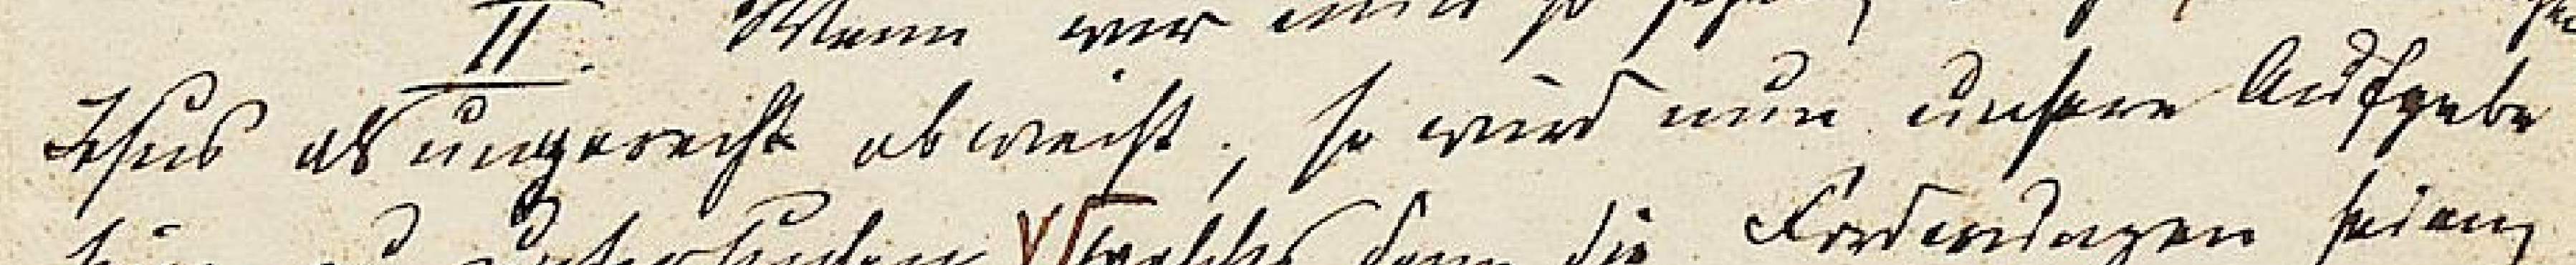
Jesus als ungerecht abweist, so wird nun unsere Aufgabe
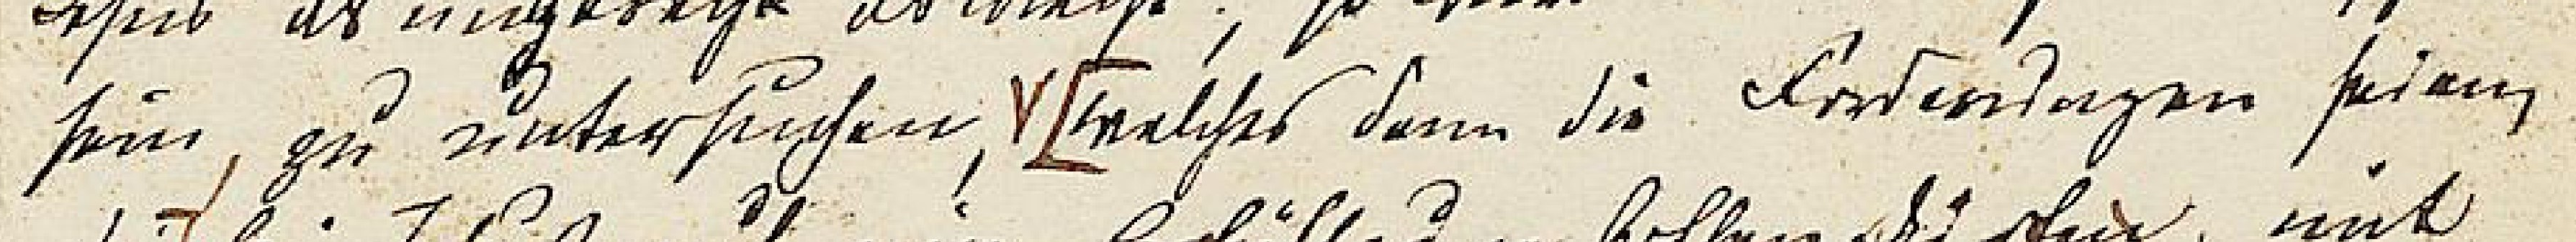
sein, zu untersuchen V [welches denn die Forderungen seien,
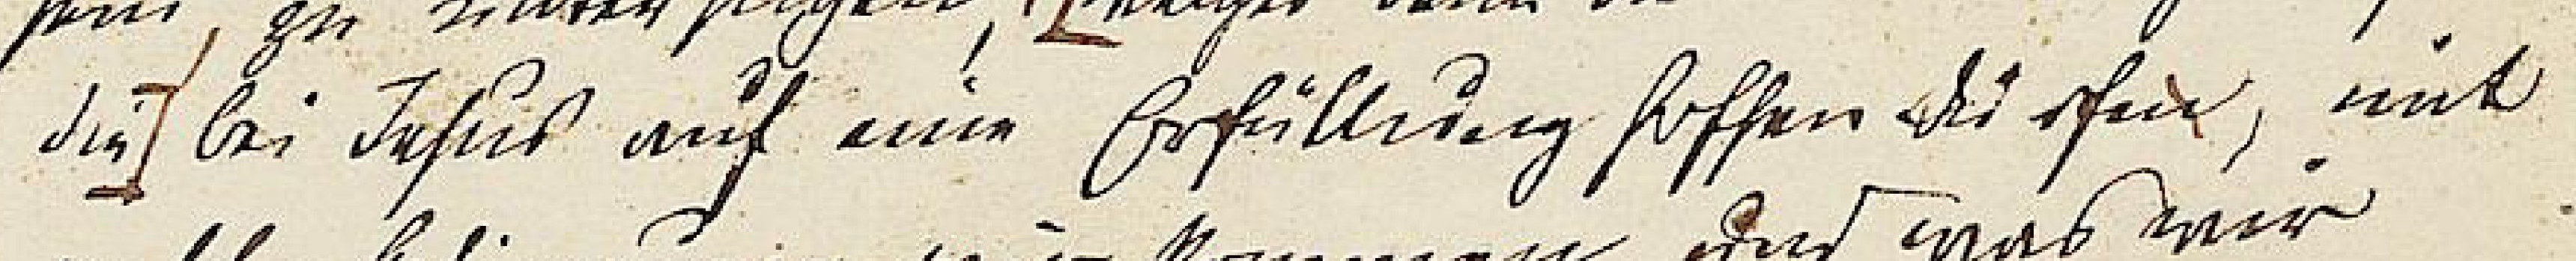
die] bei Jesus auf eine Erfüllung hoffen dürfen, mit
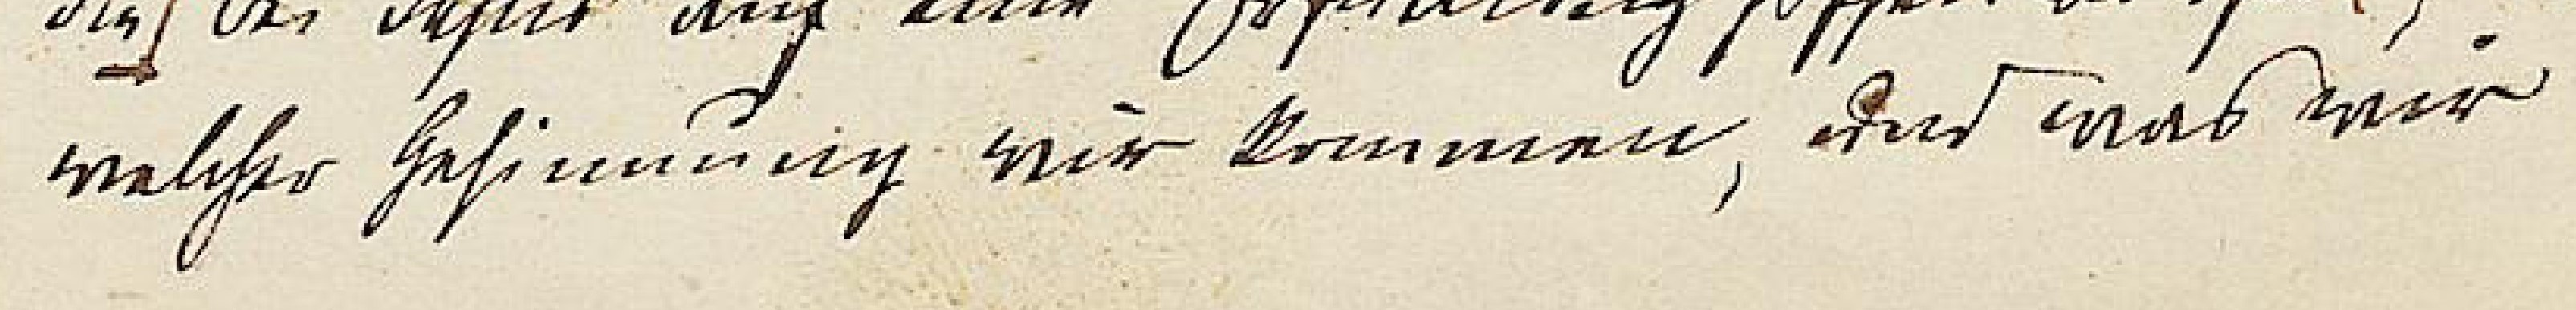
welcher Gesinnnung wir kommenm, und was wir
